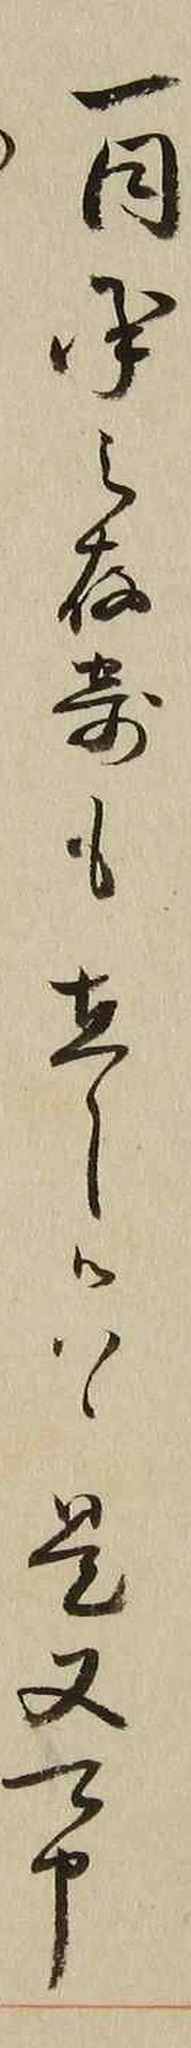一同承之存寄も在之候はゝ是又可申
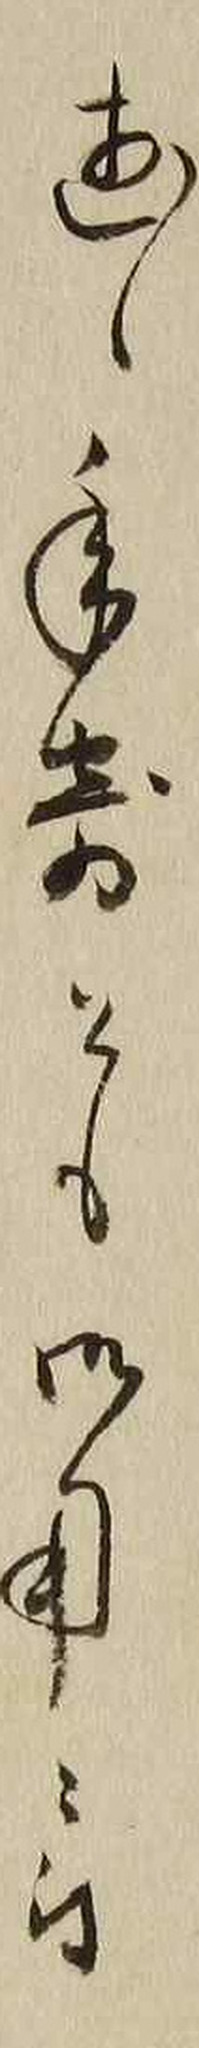述候年寄とも御用に付
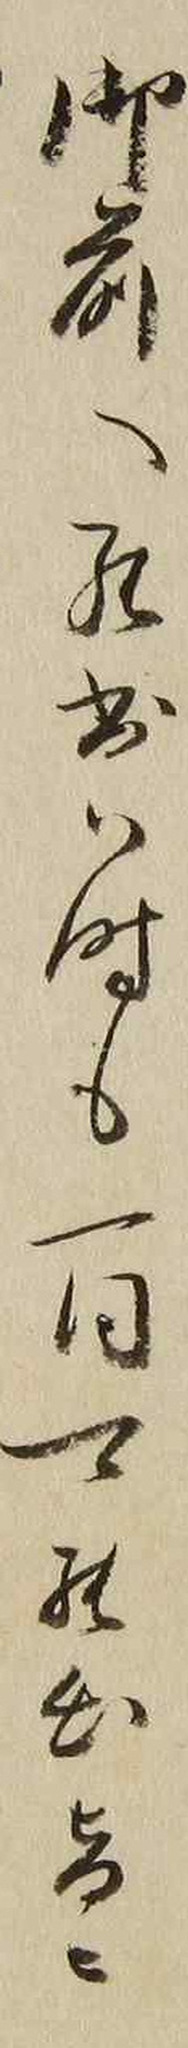御前へ罷出候時も一同可罷出旨被
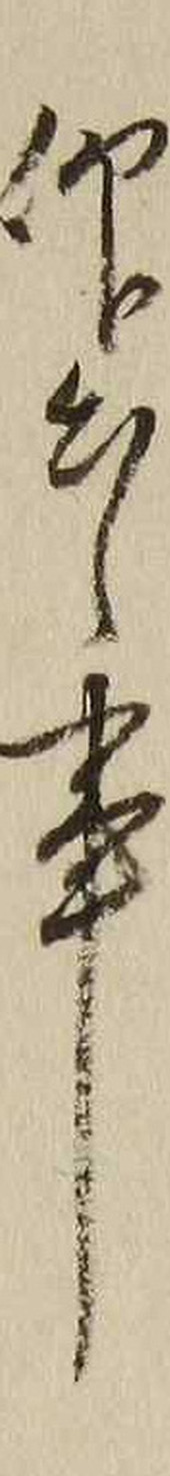仰出候事
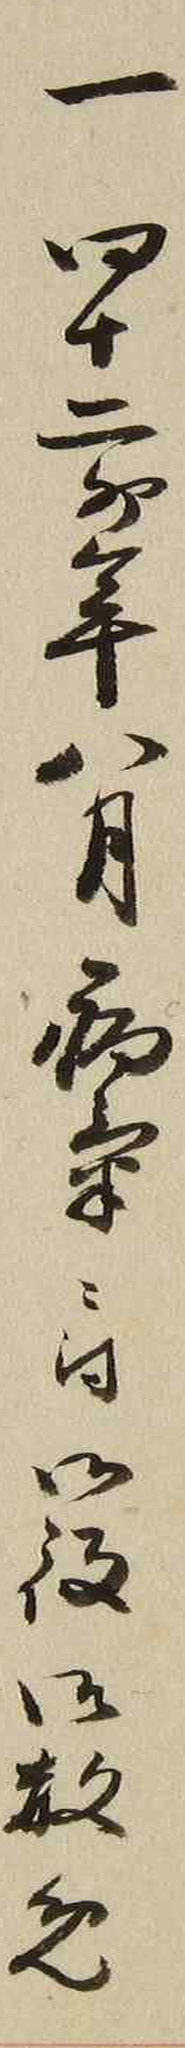一同十二卯年八月病気に付御役御赦免
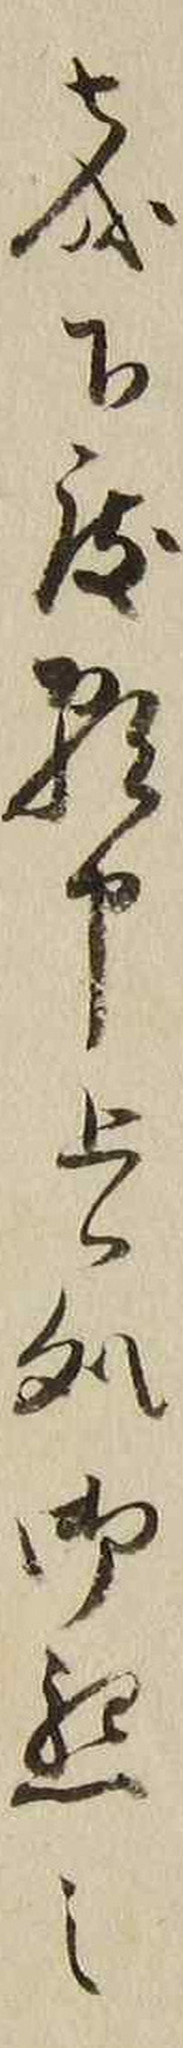被成下度願申上候処御懇之
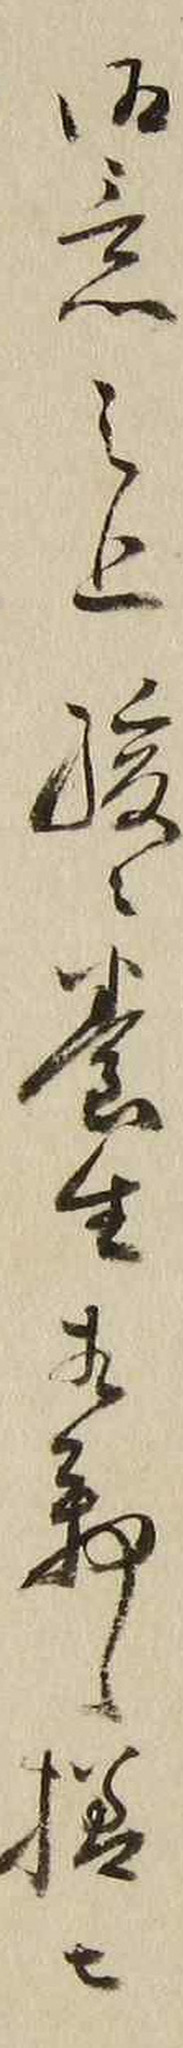御意之上緩々養生相勤候様被
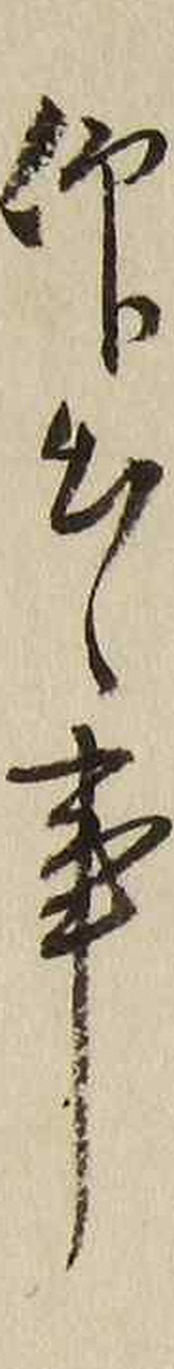仰出候事
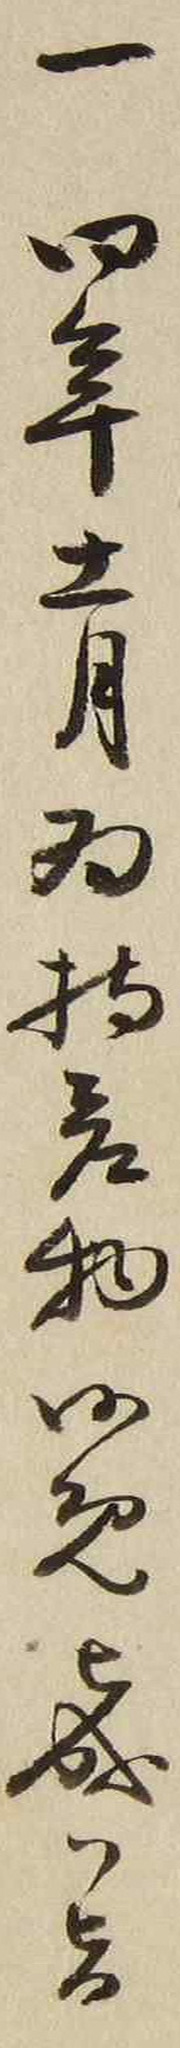一同年十一月為持差物御免被成候旨

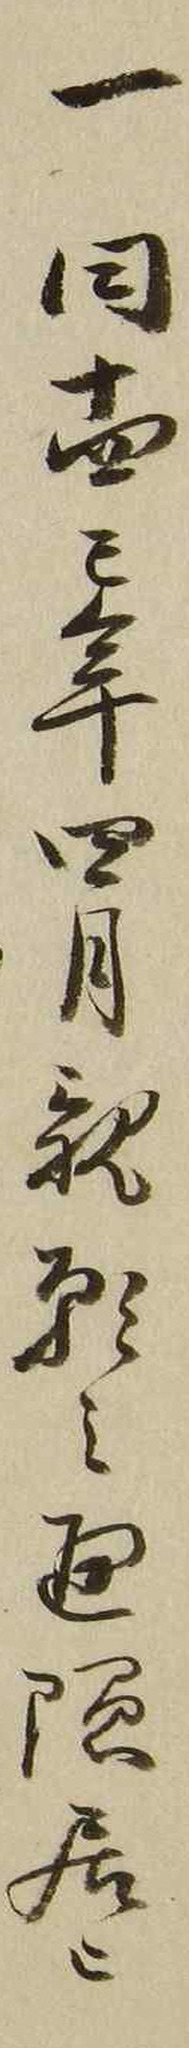一同十四巳年四月親願之通隠居被
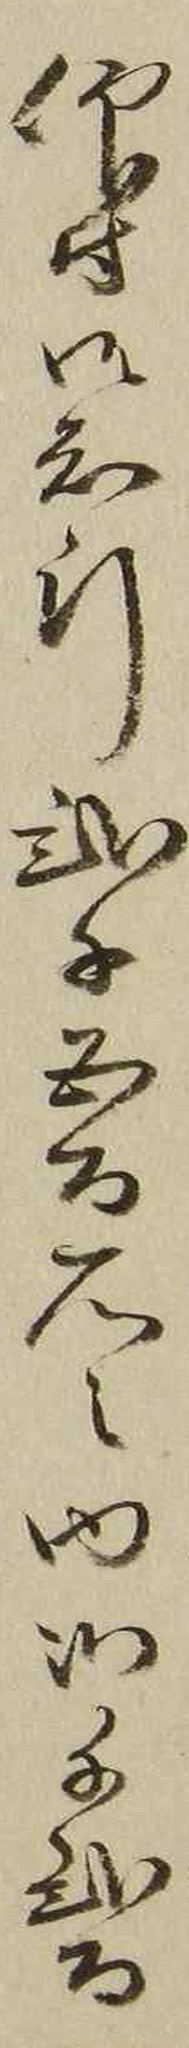仰付御知行弐千五百石之内弐千弐百
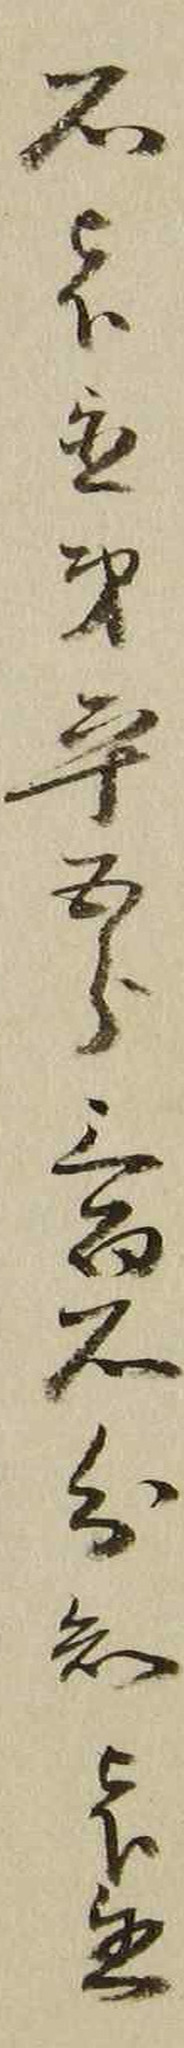石被下置弟平五郎三百石分知被下置
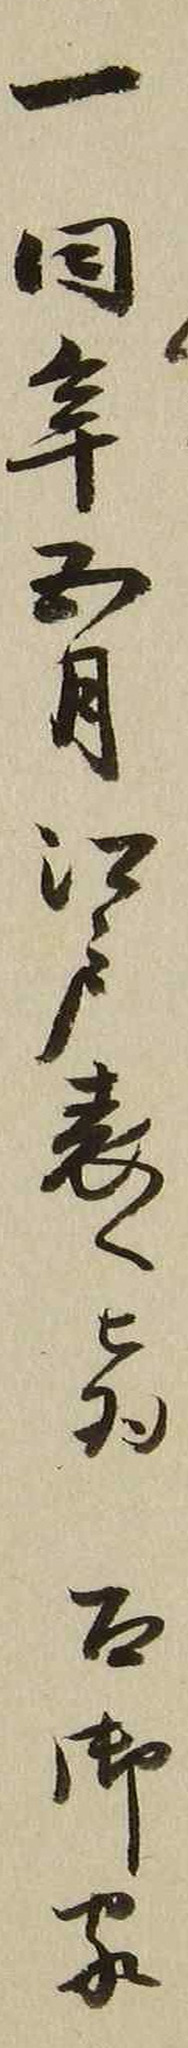一同年五月江戸表へ被為召御家
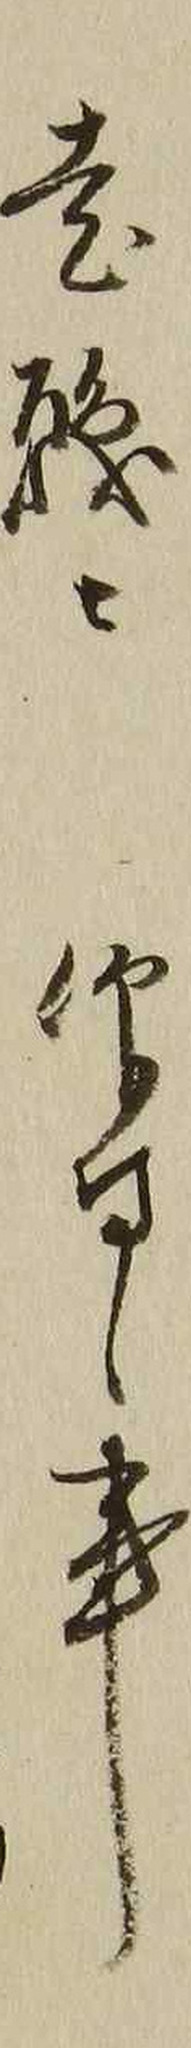老職被仰付候事
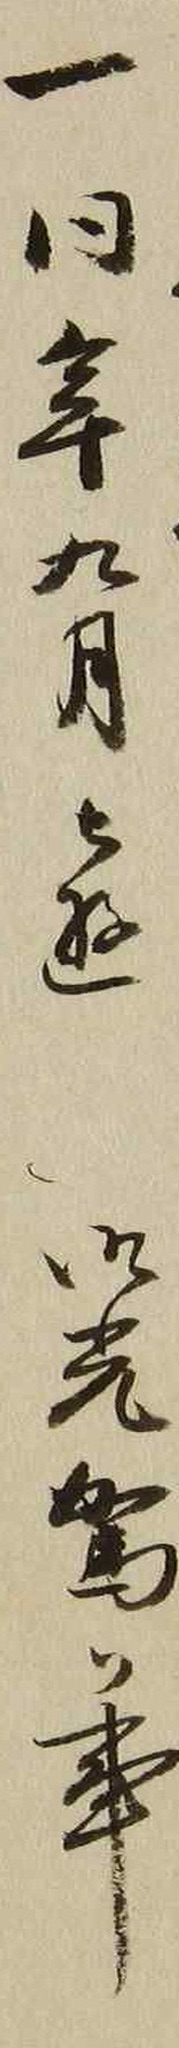一同年九月被遊御光駕候事
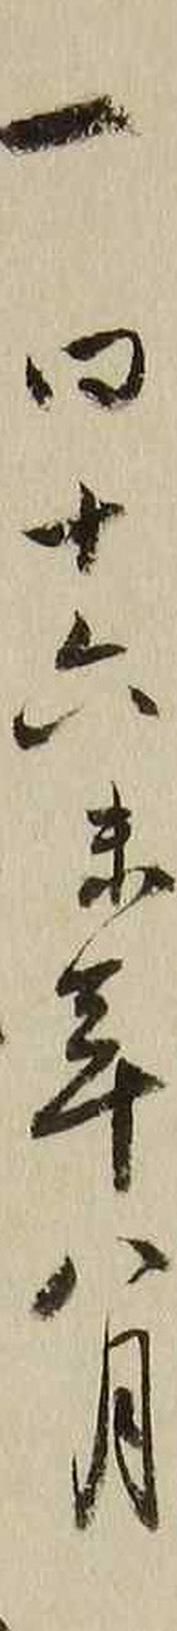一同十六未年八月
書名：諸士系譜　巻之269　さ之部1
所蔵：会津若松市立会津図書館
